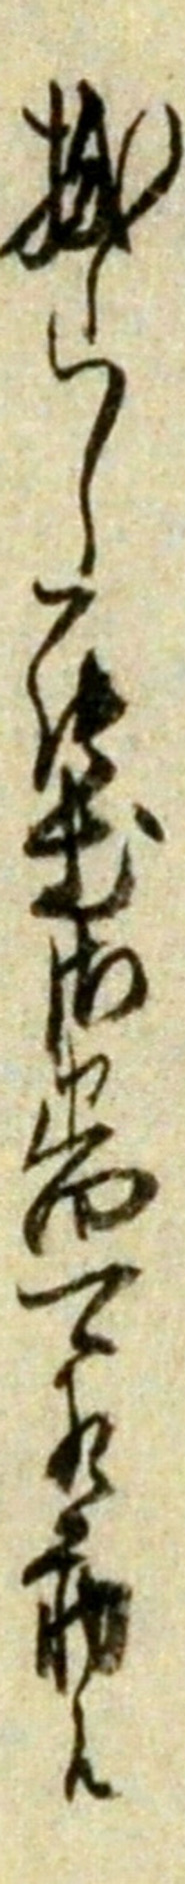掛候ハゝ罷出御番可相勤候
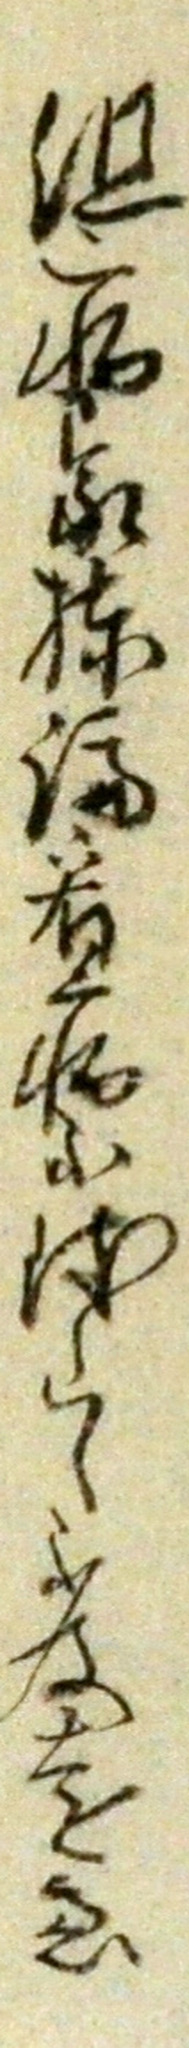但病家棟済看病不致候ハゝ不及遠慮
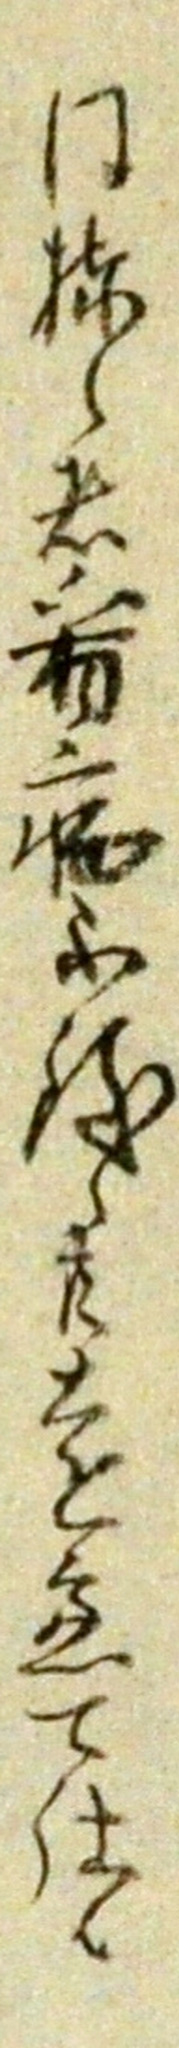同棟之者看病不致候共遠慮可仕候
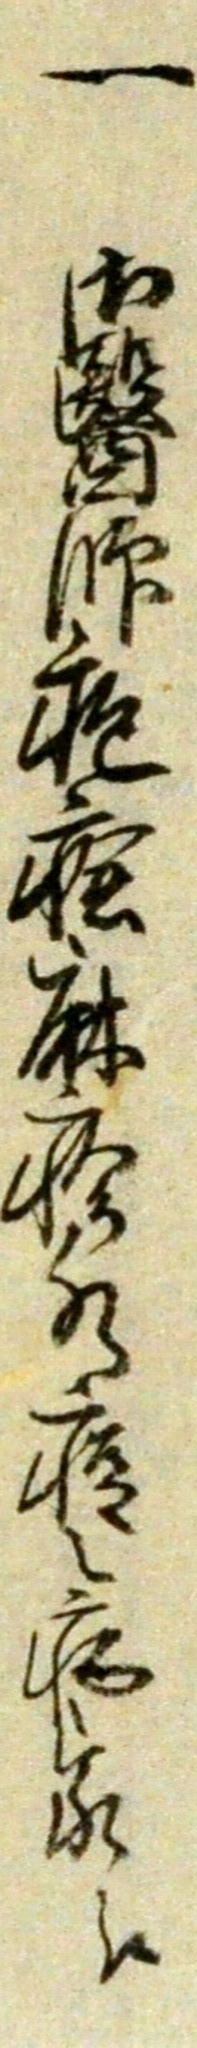一御醫師疱瘡麻疹水痘之病家え
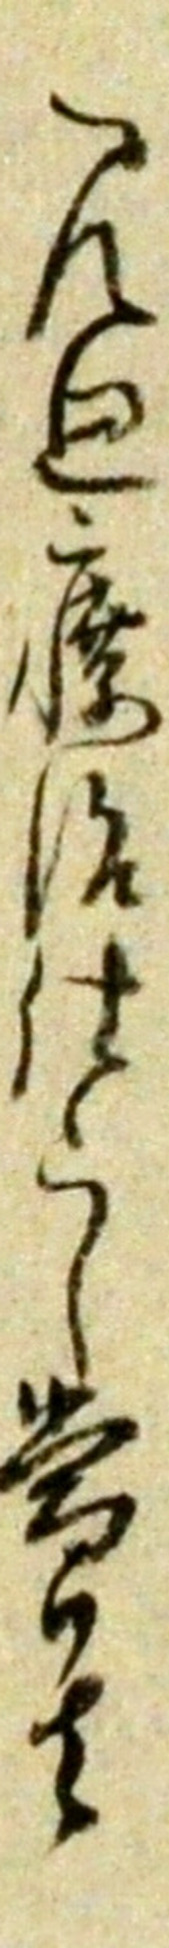見廻療治仕候ハゝ當日は
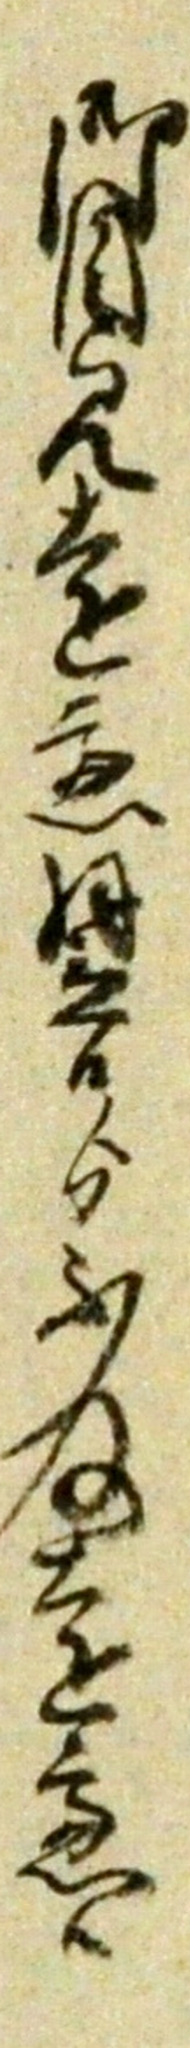御目見遠慮翌日ゟ不及遠慮候
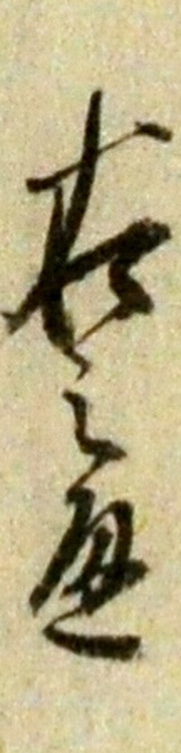右之通
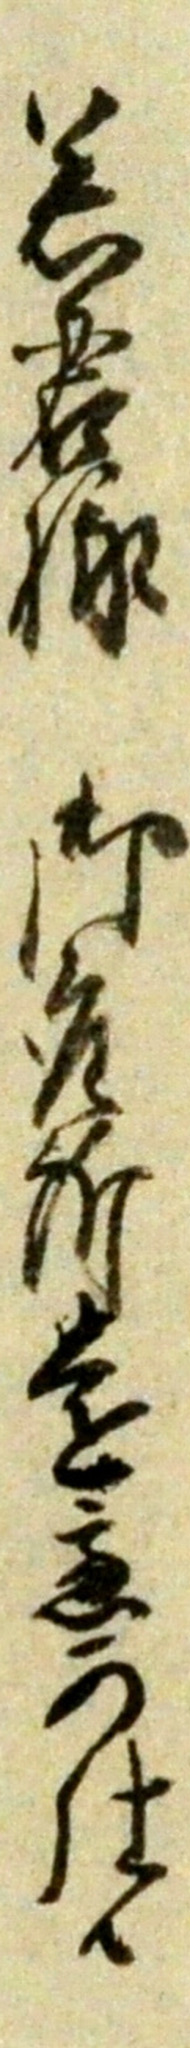若君様御座所遠慮可仕候
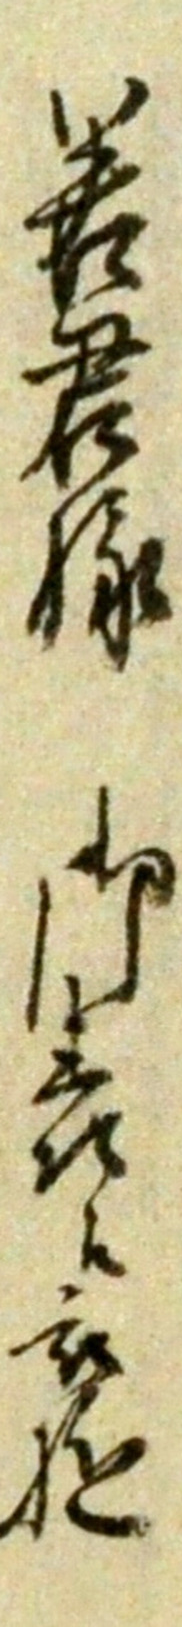若君様御表え被遊
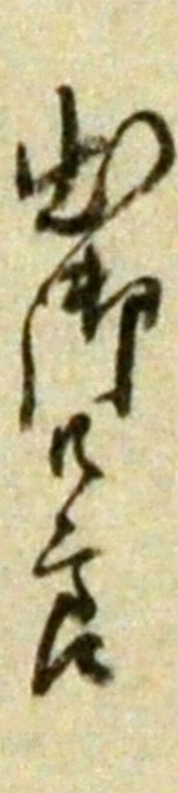出御候節
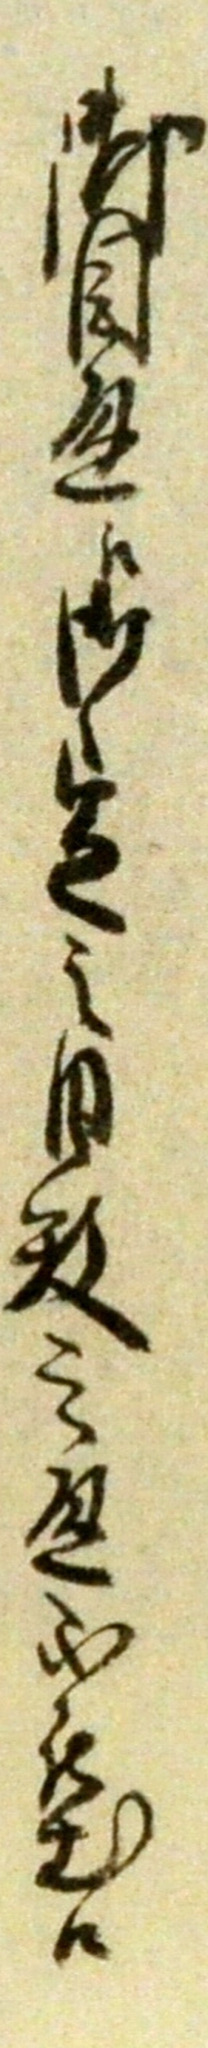御目通え御定之日数之通不罷出候
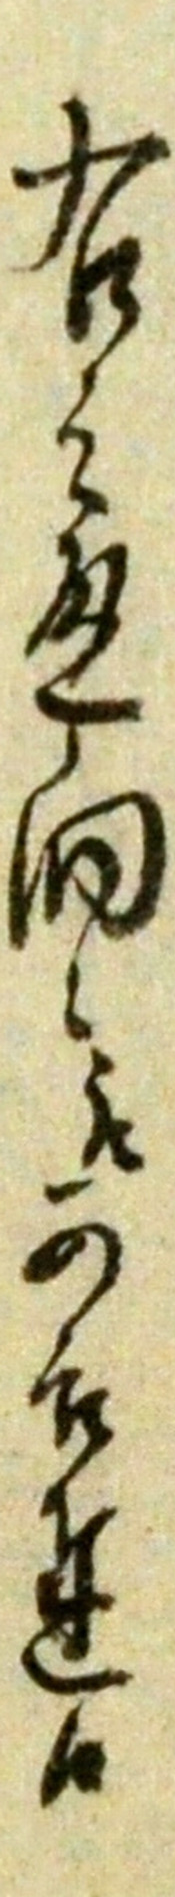右之通向々え可被達候

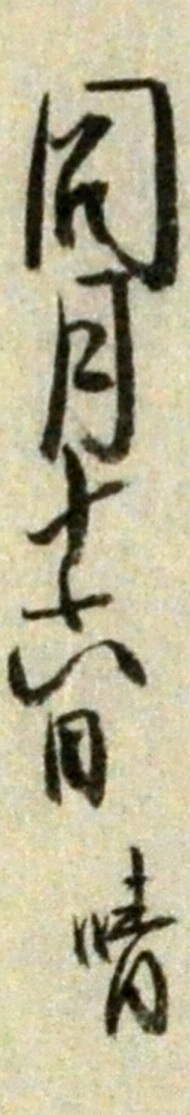同月十六日晴
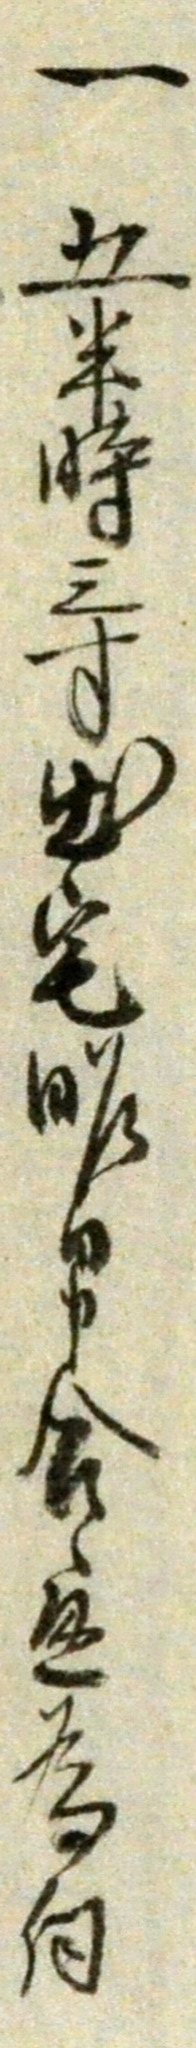一五半時三寸出宅昨日申合之通為伺
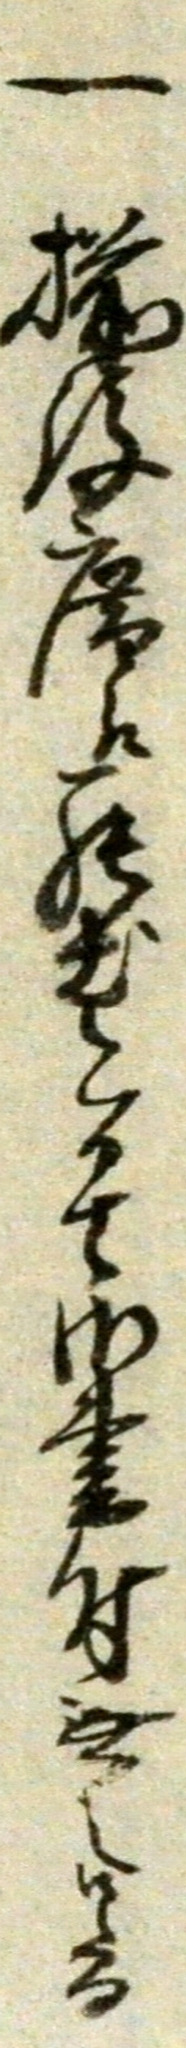一揃後席え罷出今日は御書付無之候間
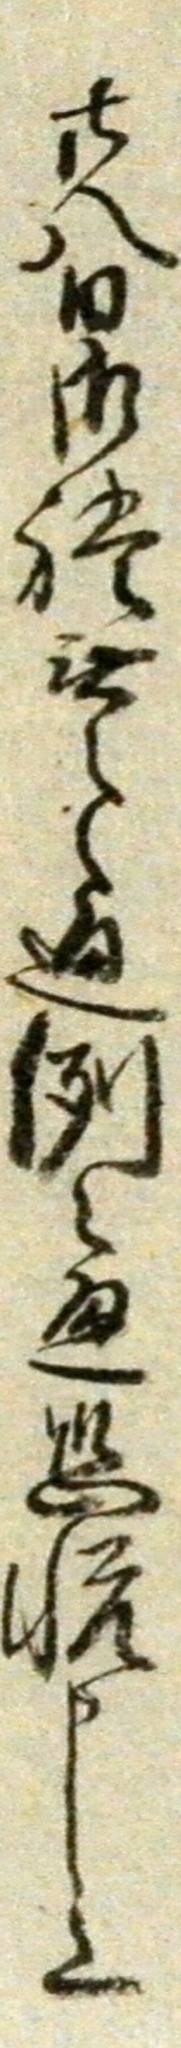廿八日御禮無之之通例之通恐悦申上
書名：若君様（家斉嫡男）誕生諸祝儀ノ節ノ留書外
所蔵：伊那市立高遠町図書館・合同会社AMANE
